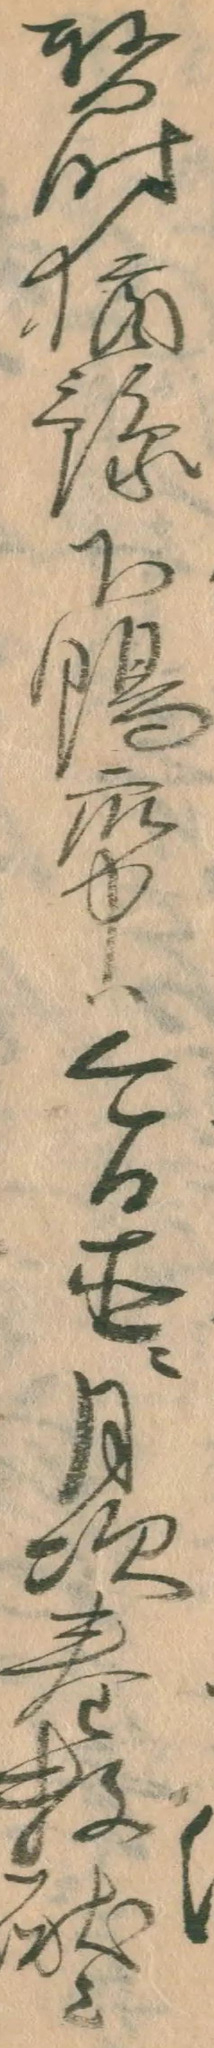暫時猶予下鴨衆中ハ今日直ニ月次巻数献上
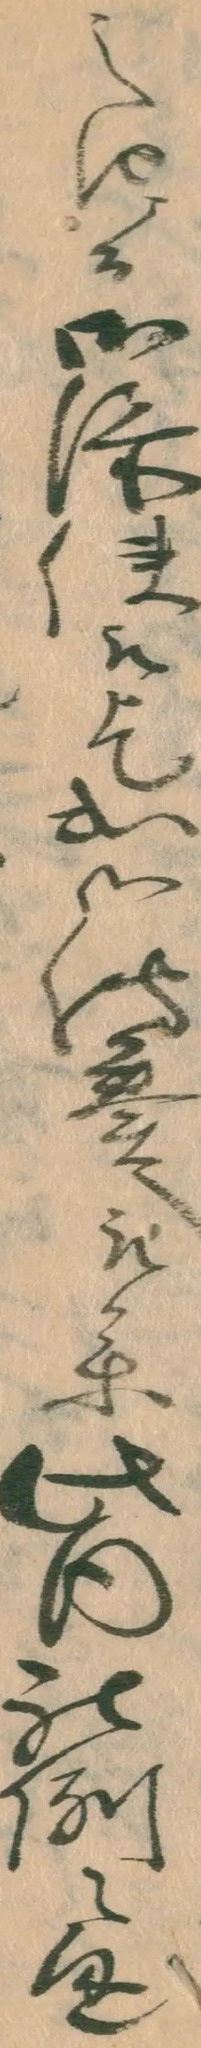之由ニ而御添使被乞出御伝奏へ被参此内社例之通
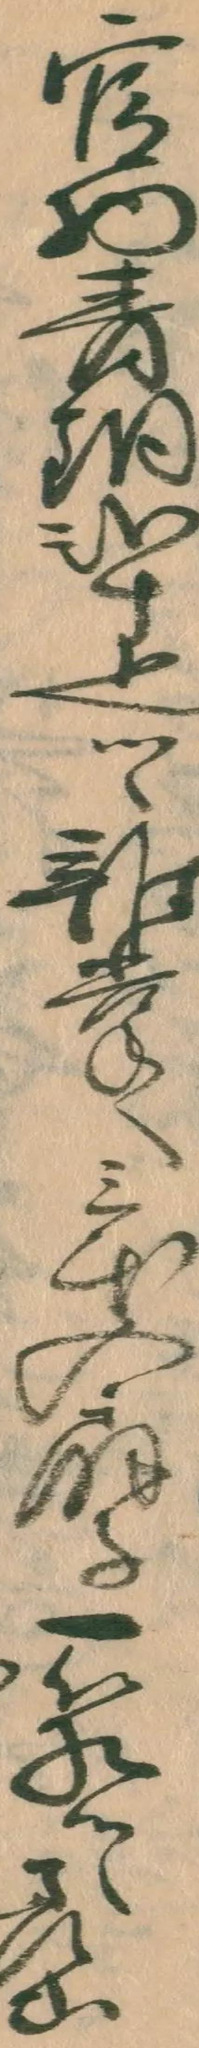官物青銅弐十疋ツヽ雑掌へ三本入扇子一箱ツヽ差出
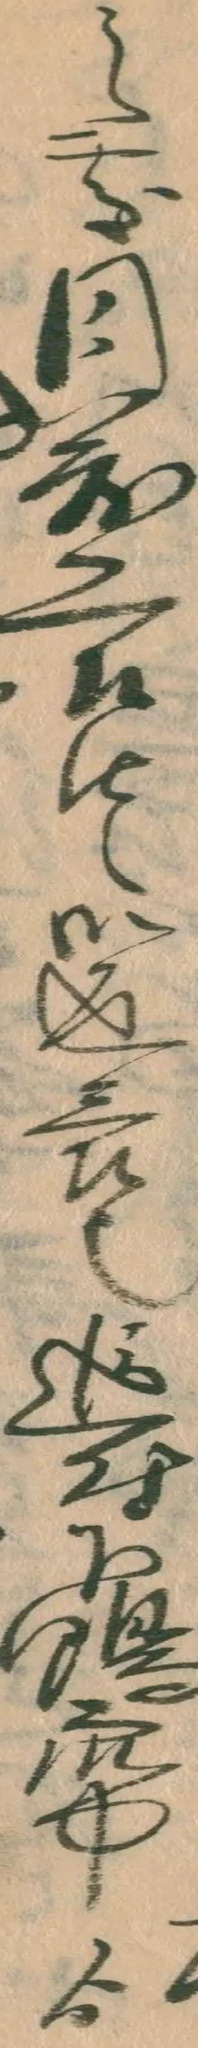之処目出度思召由之御返答也追付下鴨衆中ゟ
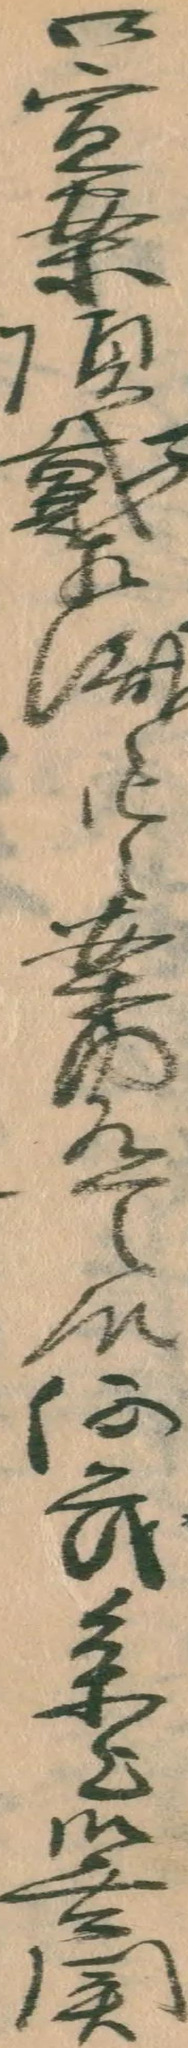口宣案頂戴相済候由之案内有之故何も参上御玄関
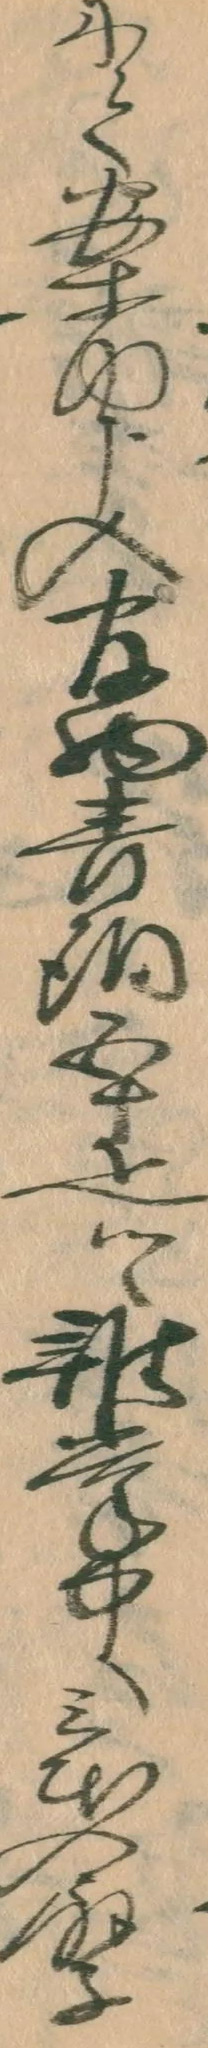にて案内申入官物青銅五十疋ツヽ雑掌中へ三本入扇子
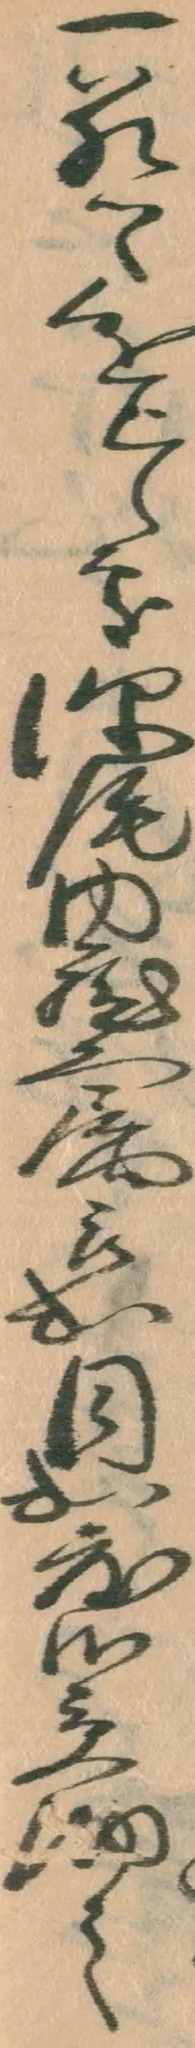一箱ツヽ進上之処深尾内蔵被出目出度御受納之
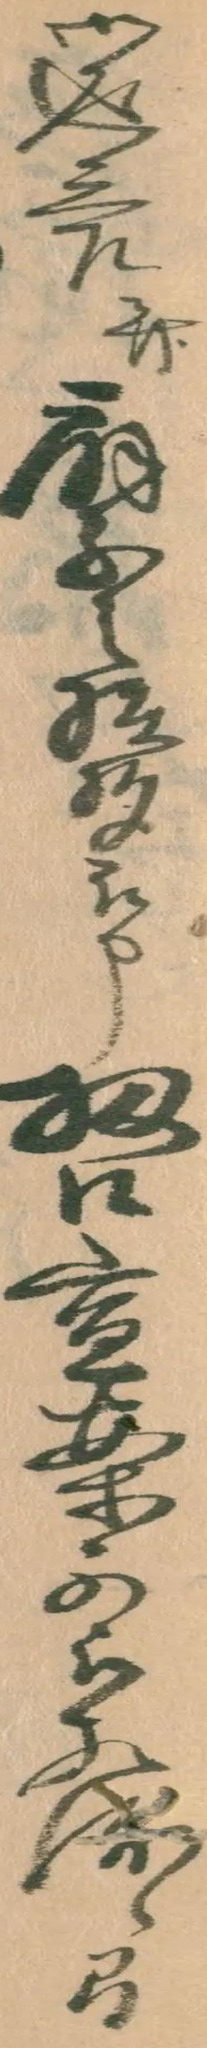御返答幷扇子之挨拶被申扨口宣案可被相渡候間
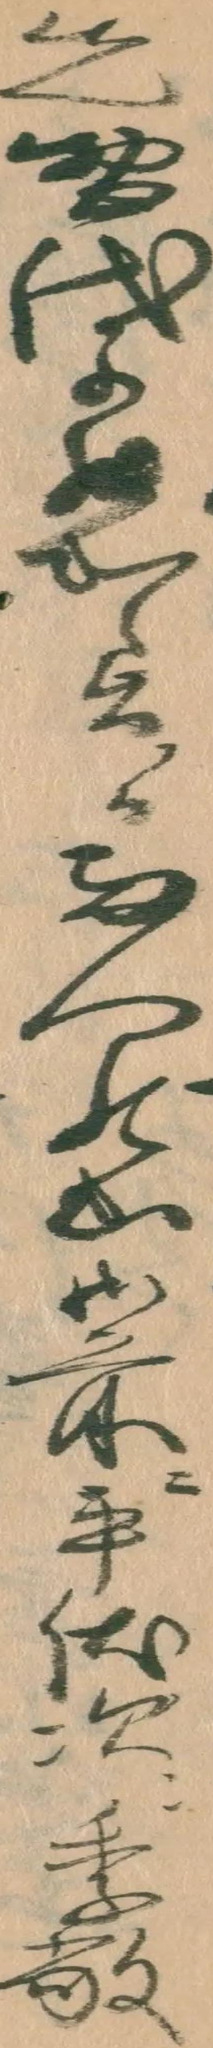先惣代可罷出候旨ニ而両人罷出御前ニ平伏次ニ季敬
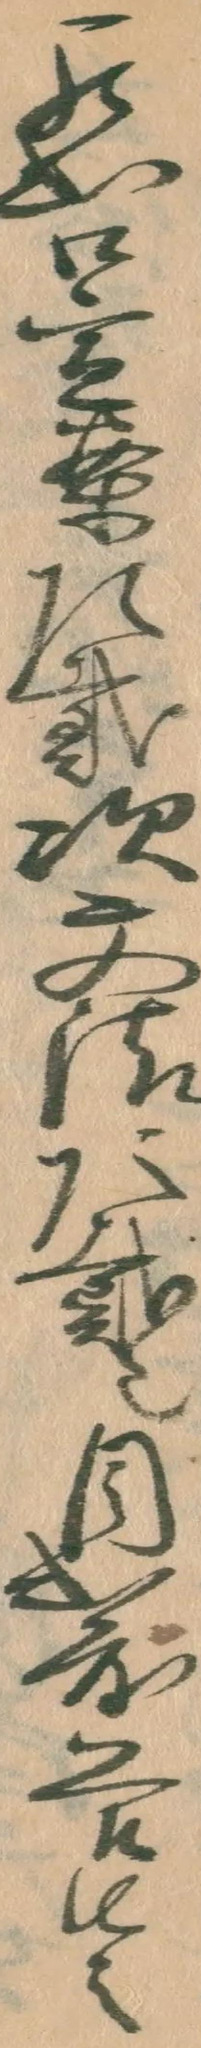罷出口宣案頂戴次文清頂戴也目出度思召由之
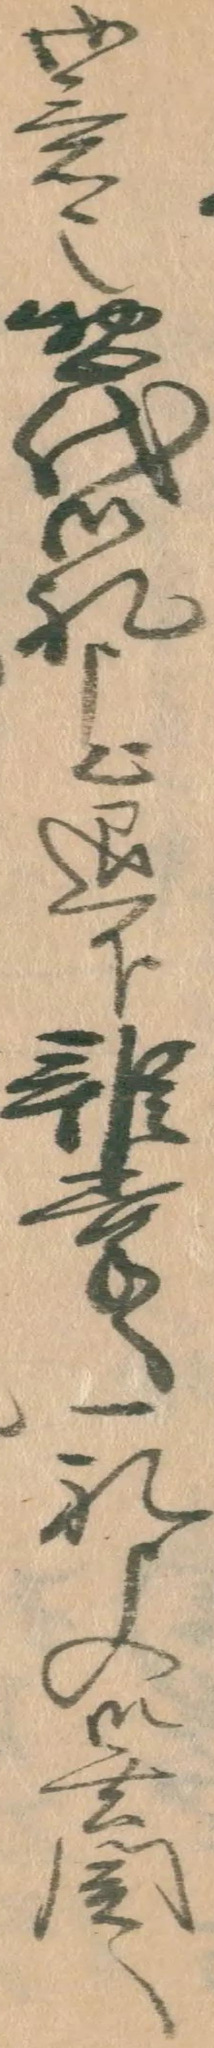御意也惣代御礼申上退下雑掌へ一礼申入御玄関へ
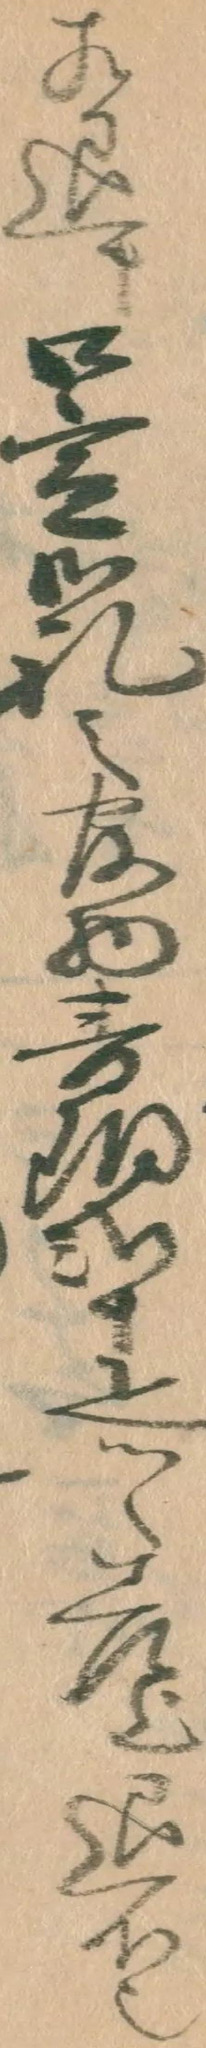相退キ口宣御礼之官物青銅弐十疋ツヽ差上退下也
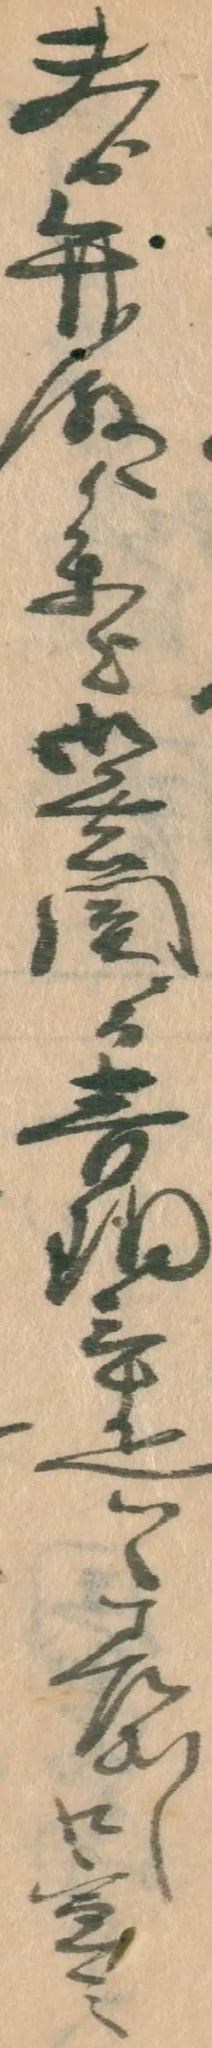夫ゟ弁殿へ参上御玄関ニ而青銅三十疋ツヽ差出し口宣之
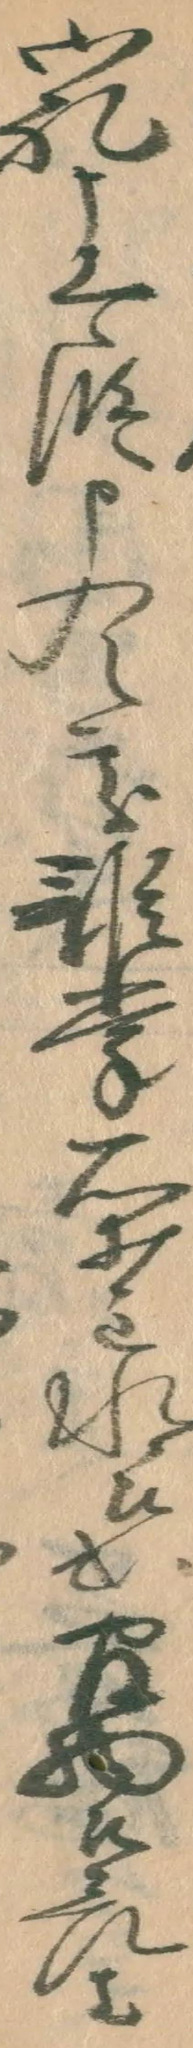御礼申上候段申入候処雑掌石井主水被出官物被差上
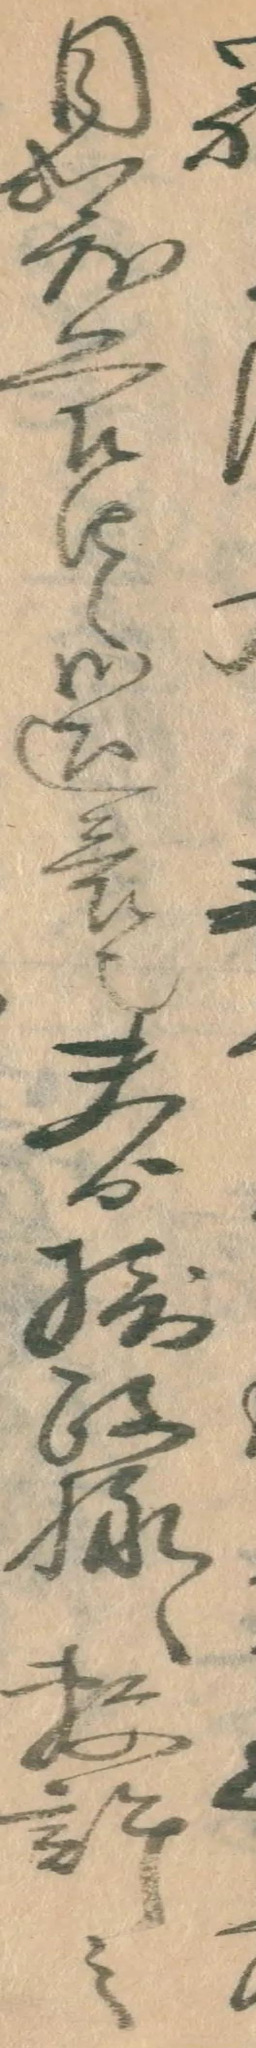目出度思召由之御返答也夫ゟ摂政様へ勅許之
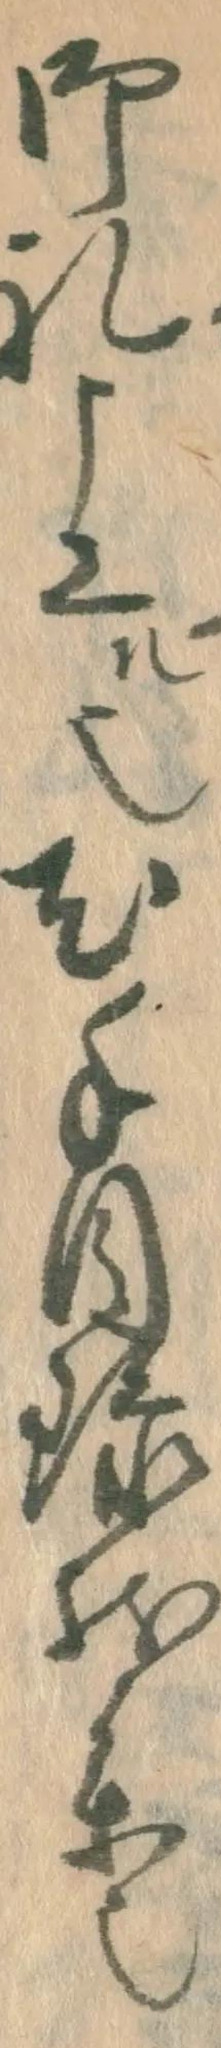御礼申上ル也尤手目録持参也
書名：賀茂社記録. 第60冊
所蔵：国立国会図書館 National Diet Library, JAPAN
